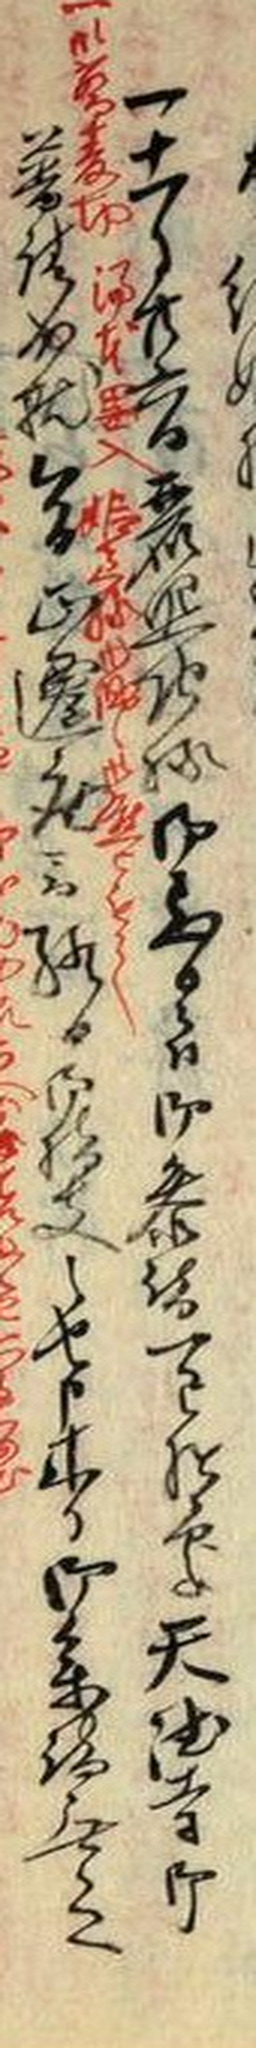普請成就今日正遷座二而終日御指支之由申来り御参詣無之
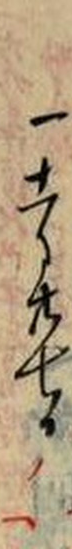一十一月廿七日

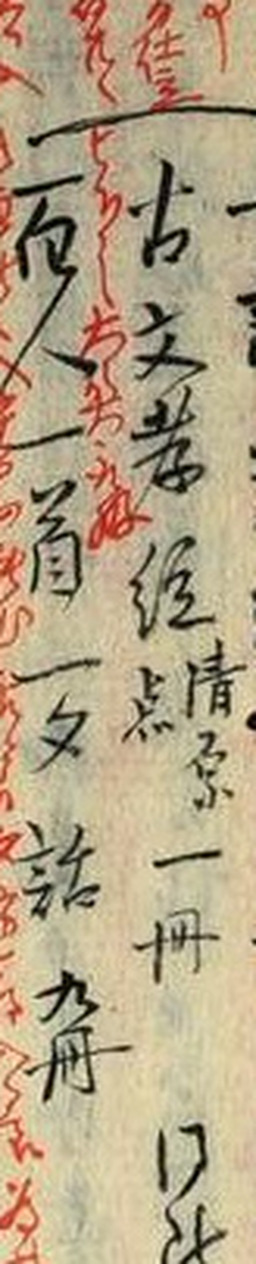百人一種一夕話九冊
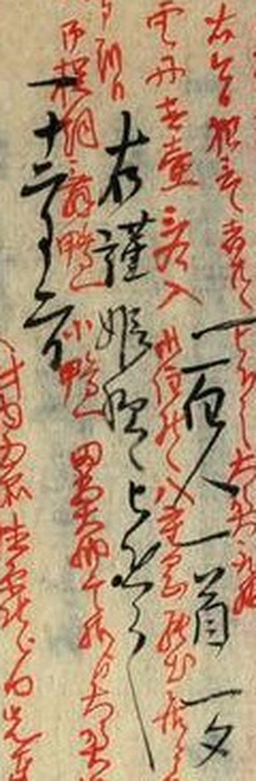右謹姫様へ被進之
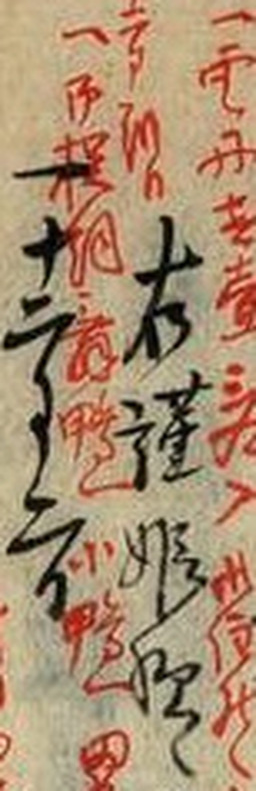一十二月二日
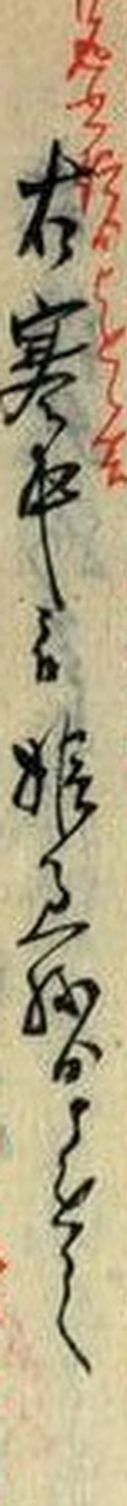右寒中ニ付姫君様ゟ被進之
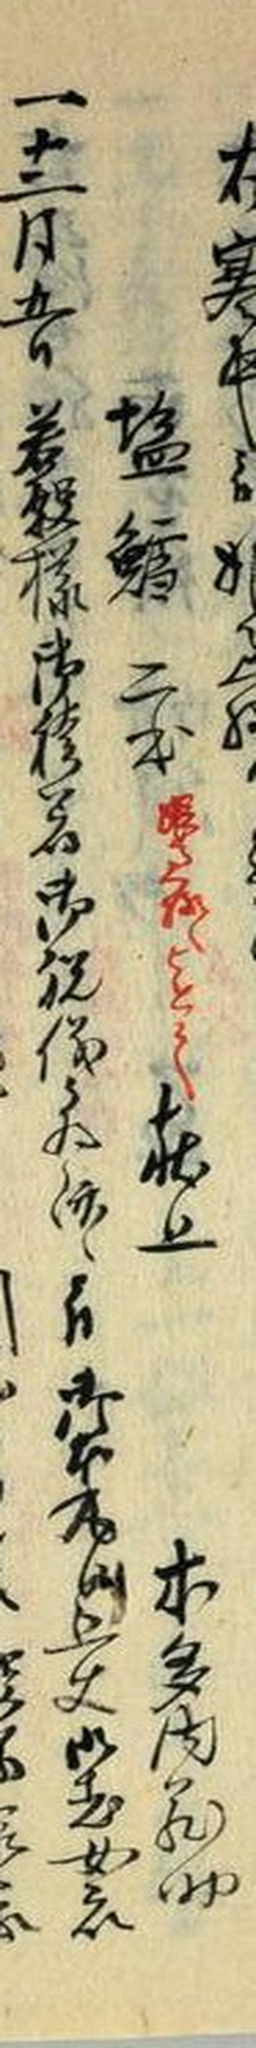一十二月五日若殿様御袴着御祝儀為済候ニ付御本丸御上使御老女衆
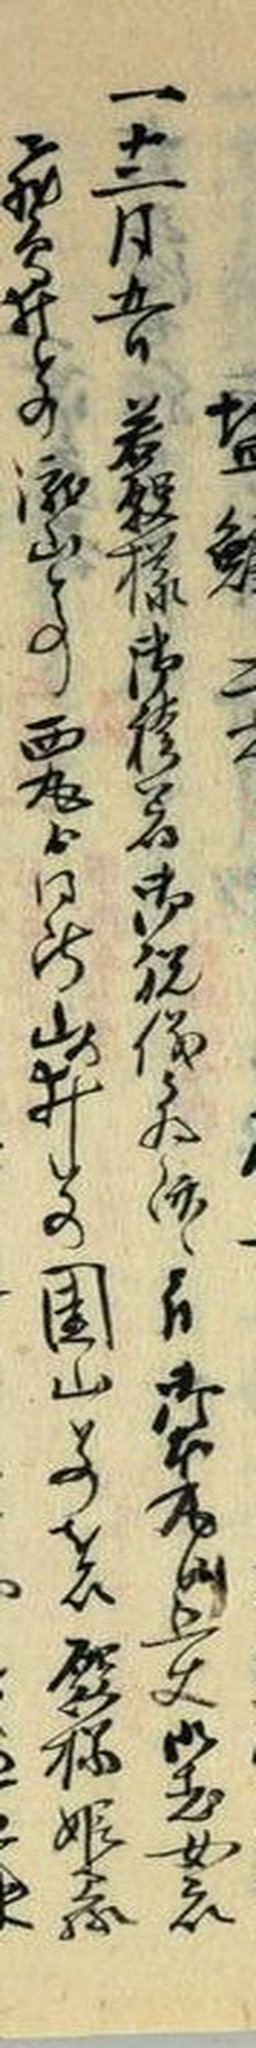飛鳥井との瀧山との西丸ゟ同断山の井との園山とのを以殿様姫君様
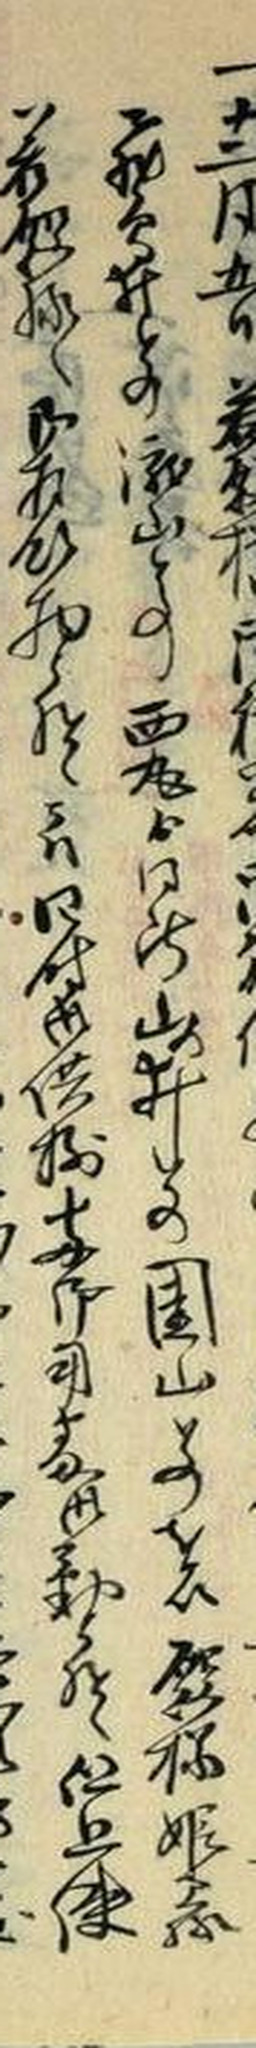若殿様へ御拝領物被遊候ニ付四時御供揃両御用番御勤被遊候但上使
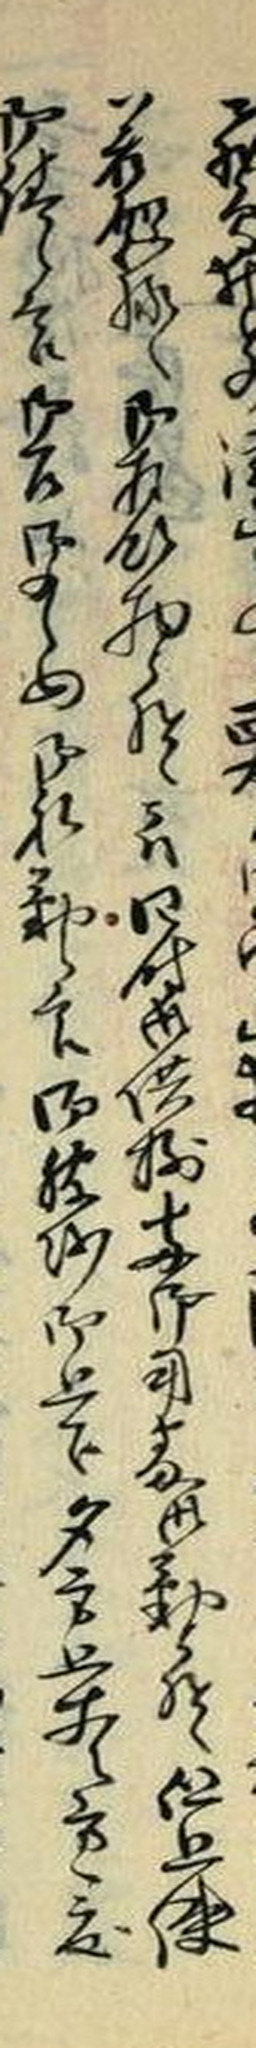御請候節御召御のしめ御礼勤候節御服紗御上下夕方御上使之方へ度
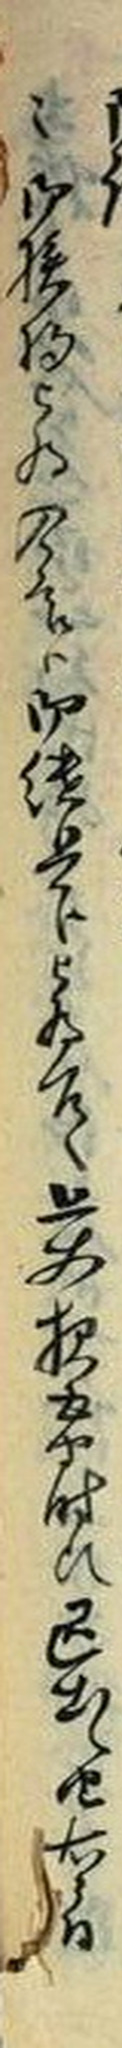々御挨拶被為入候節ハ御継上下被為召候上使夜五半時頃返出候由右二付
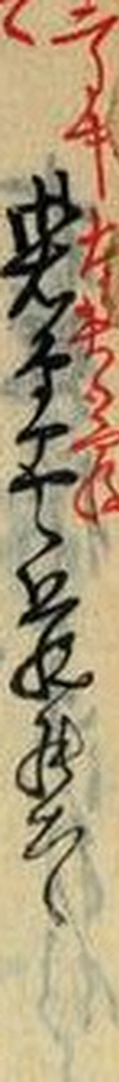御右筆部やへ恐悦罷出候
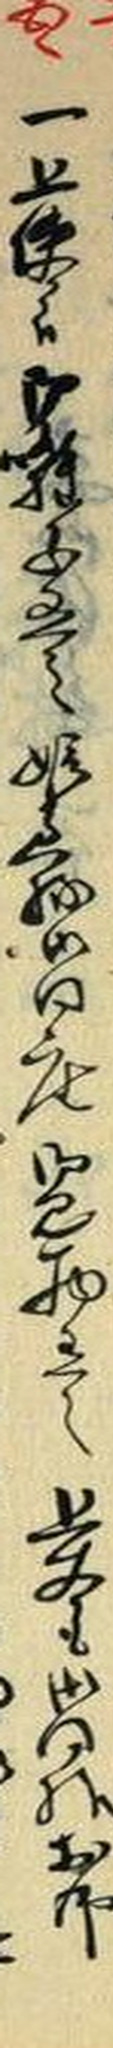一上使ニ付御囃子有之姫君様御同座御見物有之上使も御同様於御
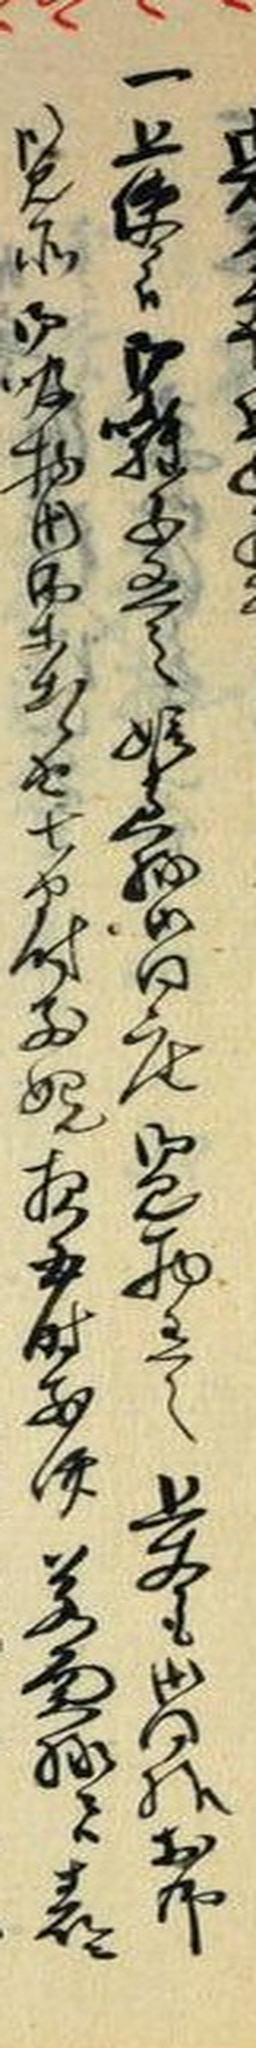覧所御吸物御酒等出候由七半時前始ル夜五時相済若殿様ニハ表ニ
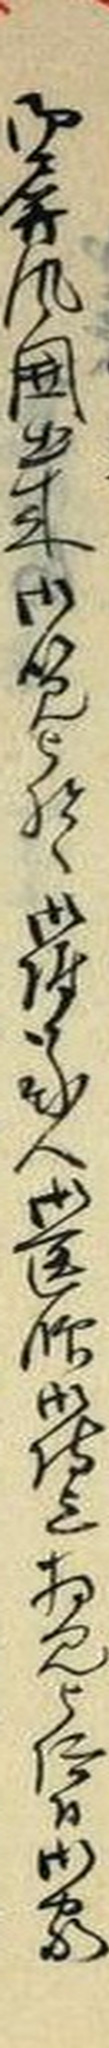御屏風囲出来御覧被遊候御附御用人御医師御坊主拝見被仰付御家
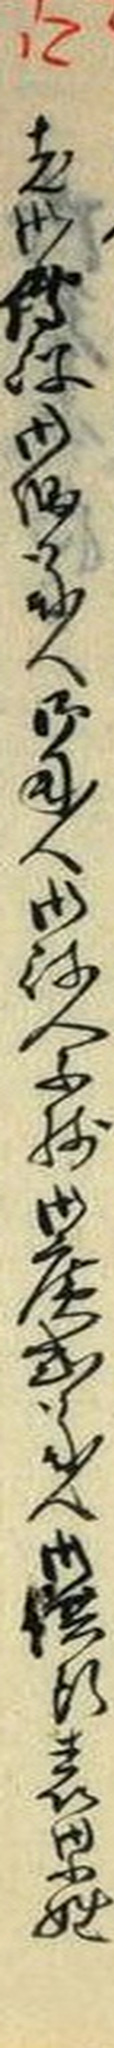老御傅役御側御用人御用人御役人不残御広式御用人御供頭表御小姓
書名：少傅日録抄（斉承付側向頭取日記、在府）
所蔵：福井県文書館 Fukui Prefectural Archives
